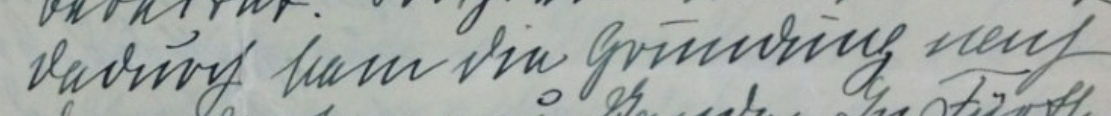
dadurch kam die Gründung nach
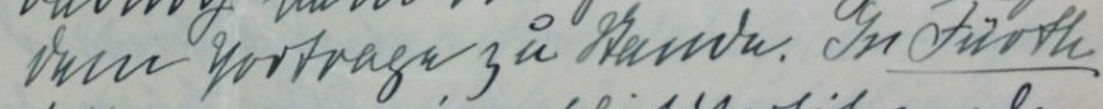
dem Vortrag zu Stande. In Fürth
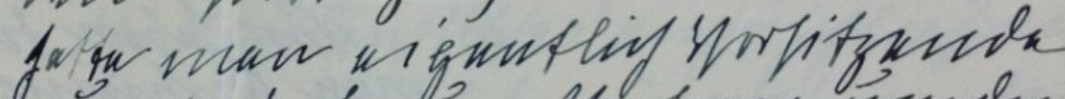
hatte man eigentlich Vorsitzende
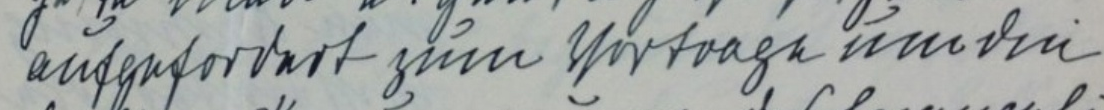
aufgefordert zum Vortrage um die
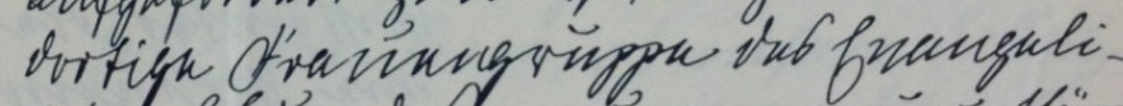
dortige Frauengruoppe des Evangeli
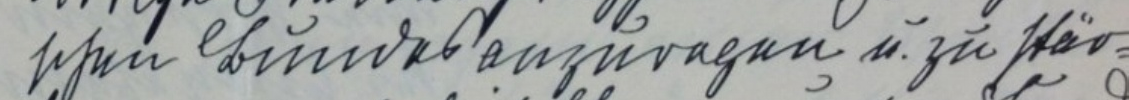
schen Bundes anzuregen u, zu stär
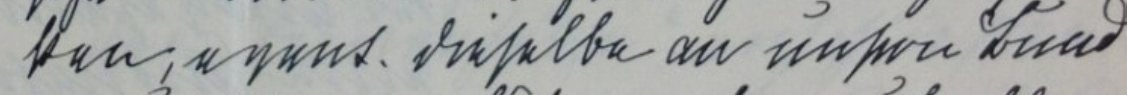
ken, eigent. dieselbe an unseren Bund
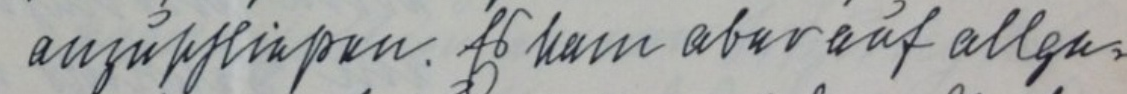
anzuschlueßen. Es kam aber auf allge
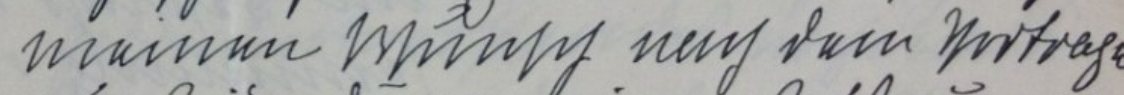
meinen Wunsch nach dem Vortrage
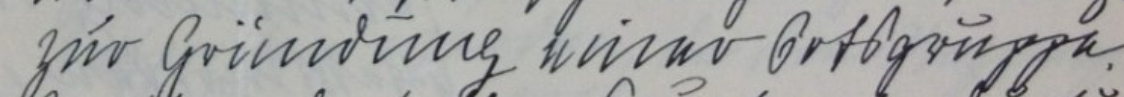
zur Gündung einer Ortsgruppe.
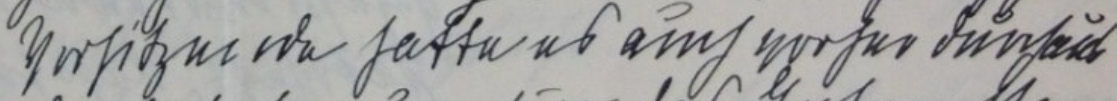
Vorsitzende hatte es auch vorher durchaus
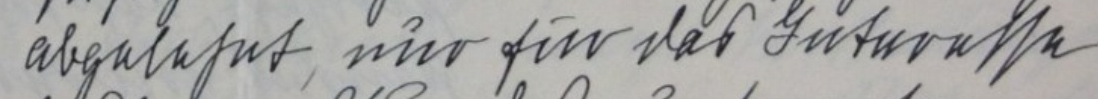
abgeleht nur für das Interesse
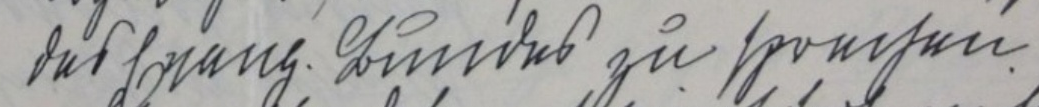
des Enag. Bundes zu sprechen.
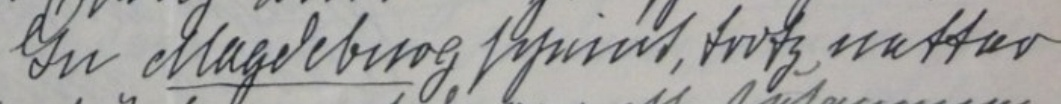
In Magdeburg scheint trotz netter
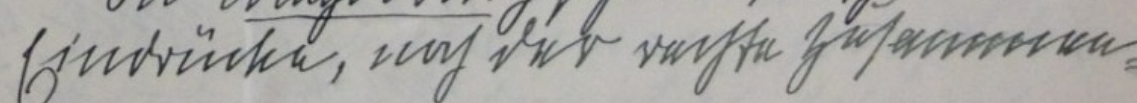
Eindrücke uns der recht Zusammen
